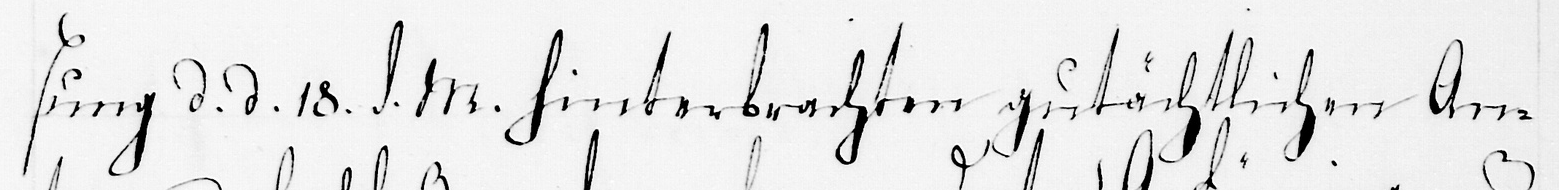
sung d. d. 18. d. M. hinterbrachten gutächtlichen An¬
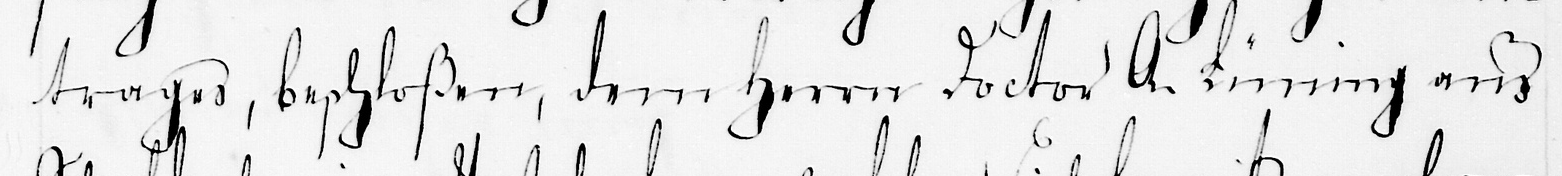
trages, beschloßen, dem Herrn Doctor A. Lüning aus
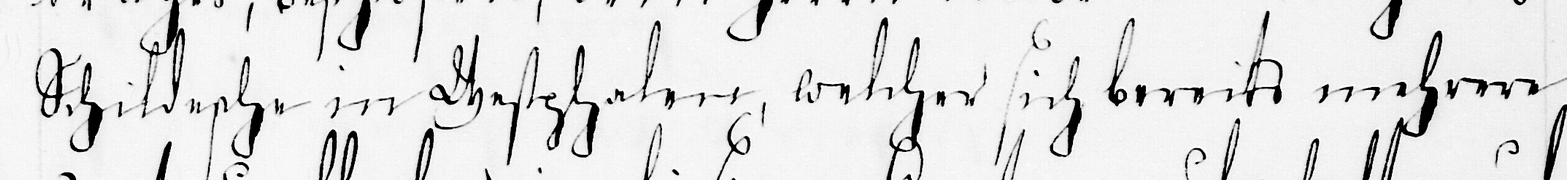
Schildesche in Westphalen, welcher sich bereits mehrere
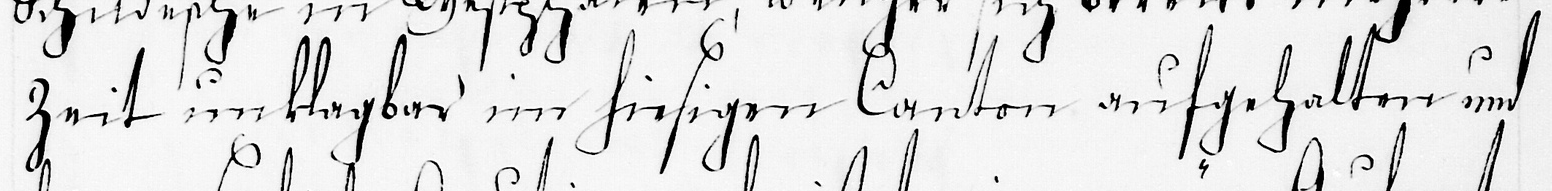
Zeit unklagbar im hiesigen Canton aufgehalten und
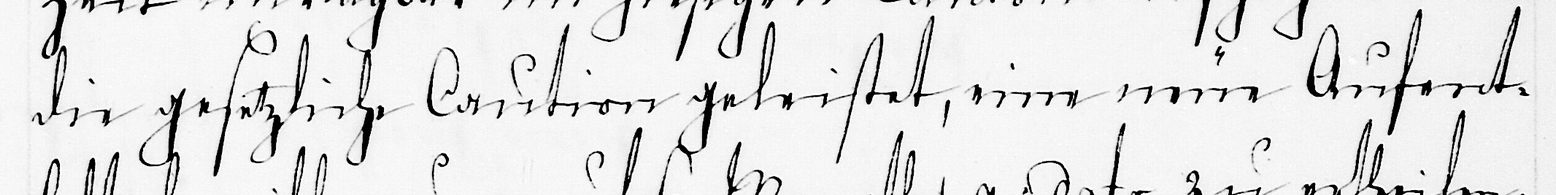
die gesetzliche Caution geleistet, eine neue Aufent¬
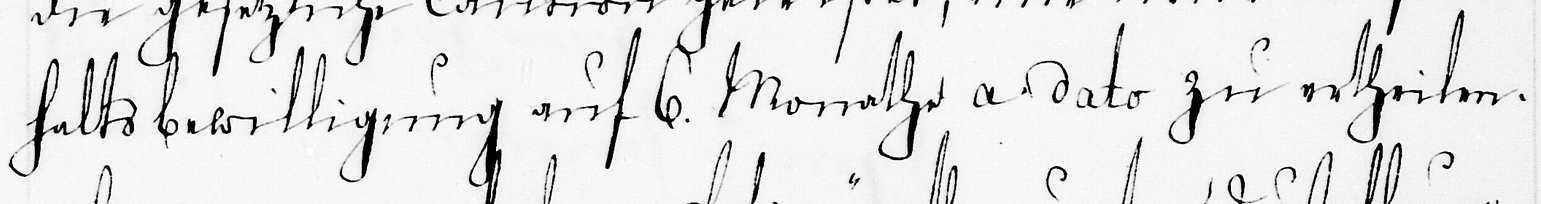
haltsbewilligung auf 6. Monathe a dato zu ertheilen.
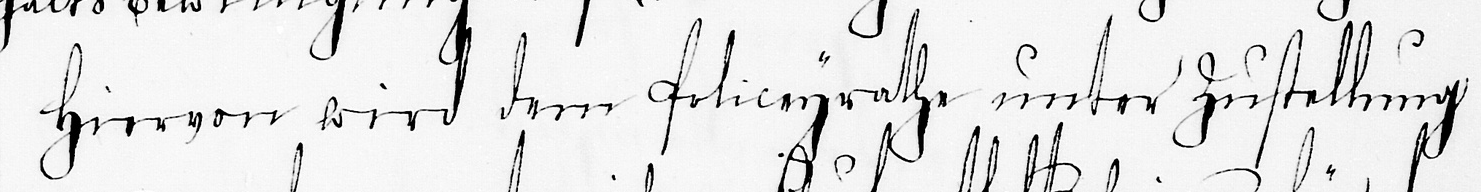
Hiervon wird dem Policeyrathe unter Zustellung
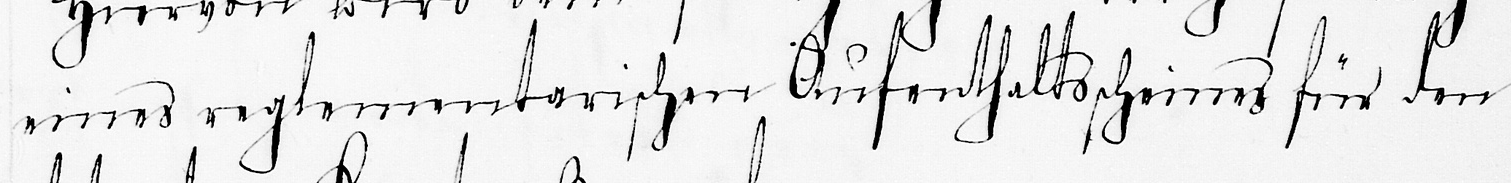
eines reglementarischen Aufenthaltsscheines für den
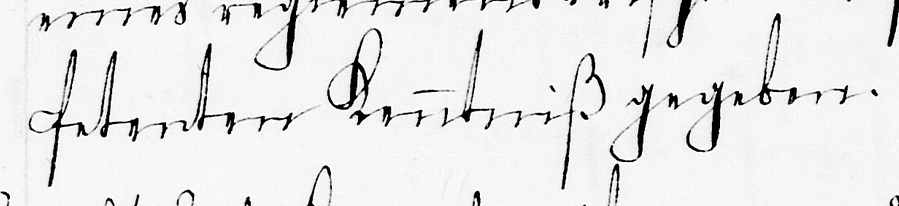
Petenten Kenntniß gegeben.
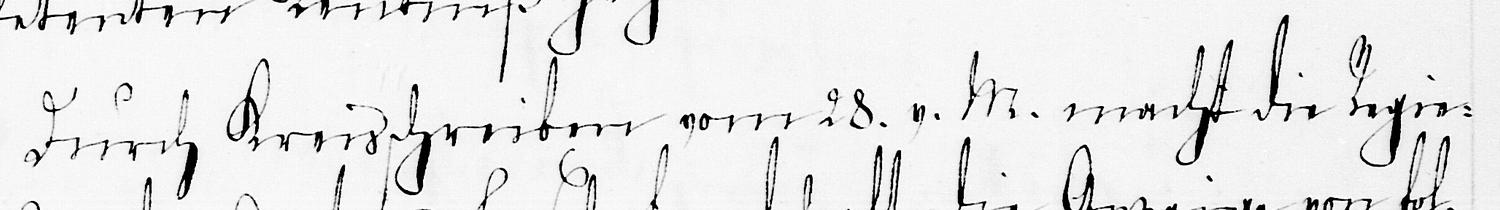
Durch Kreisschreiben vom 28. v. M. macht die Regie¬
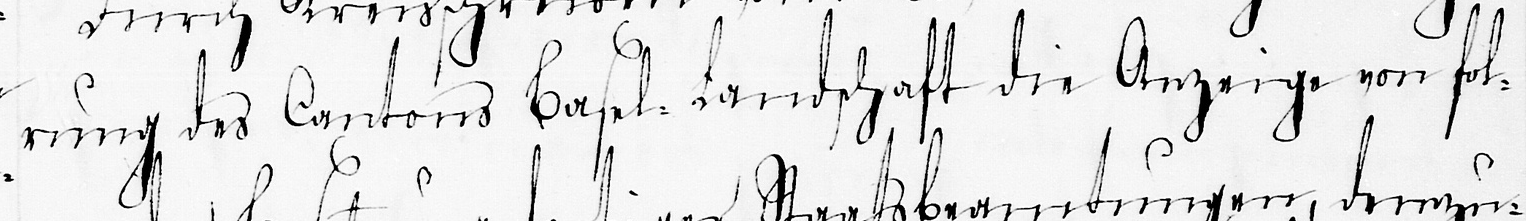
rung des Cantons Basel-Landschaft die Anzeige von fol¬
